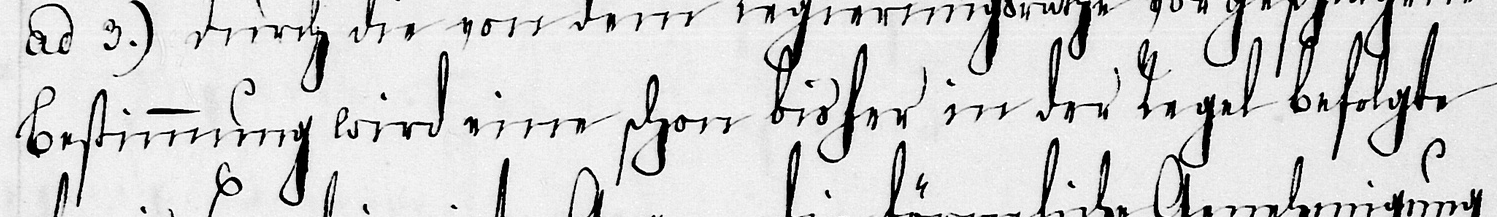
Bestimmung wird eine schon bisher in der Regel befolgte
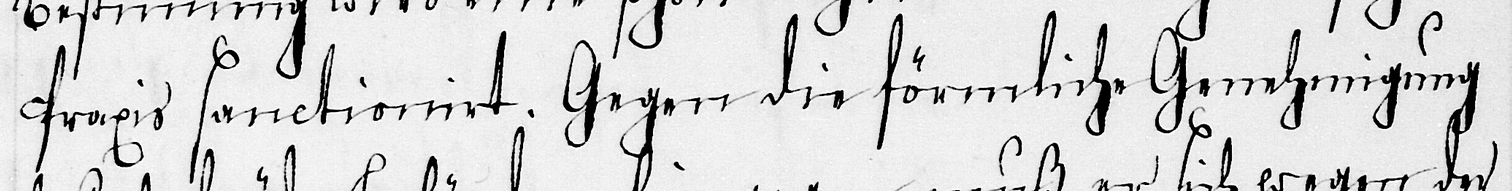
Praxis sanctionirt. Gegen die förmliche Genehmigung
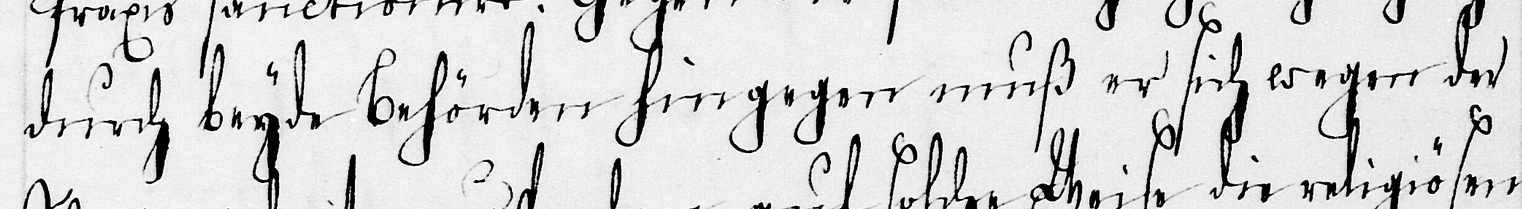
durch beyde Behörden hingegen muß er sich wegen der
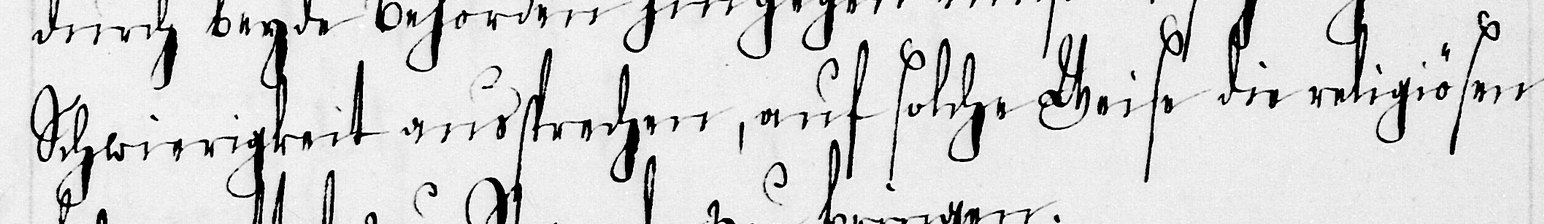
Schwierigkeit aussprechen, auf solche Weise die religiösen
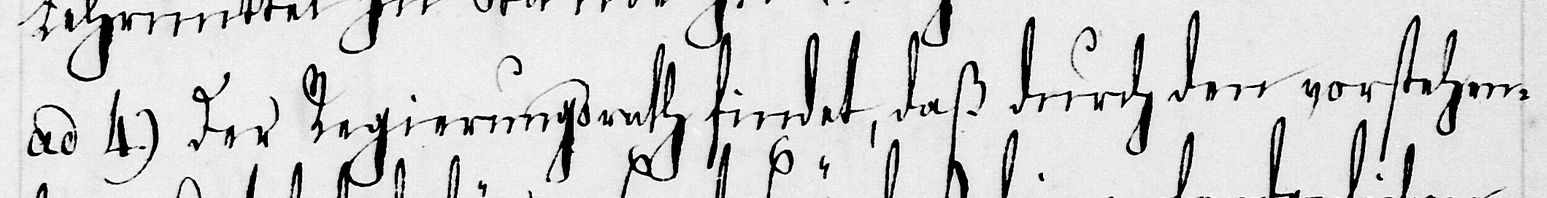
ad 4.) Der Regierungsrath findet, daß durch den vorstehen¬
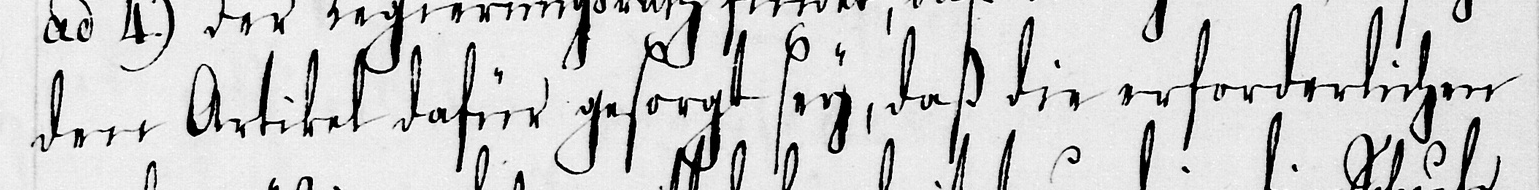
den Artikel dafür gesorgt sey, daß die erforderlichen
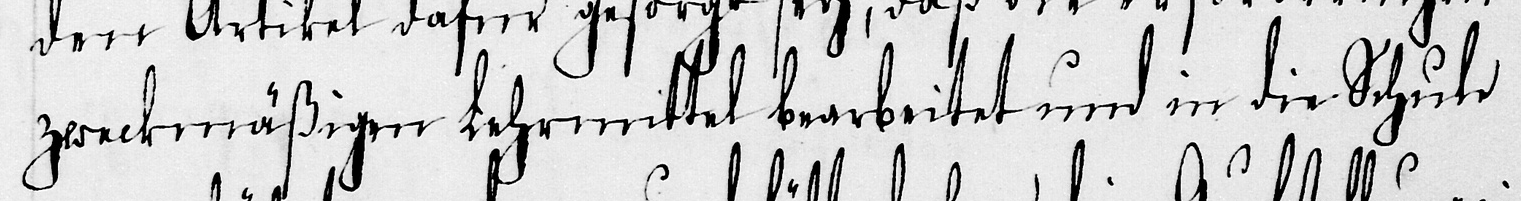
zweckmäßigen Lehrmittel bearbeitet und in die Schule
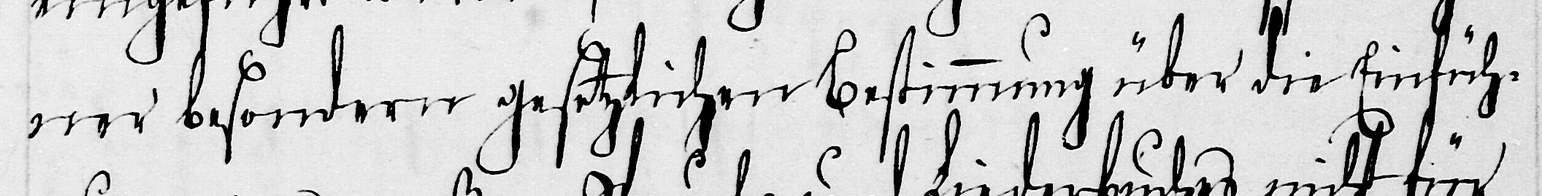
ner besondern gesetzlichen Bestimmung über die Einfüh¬
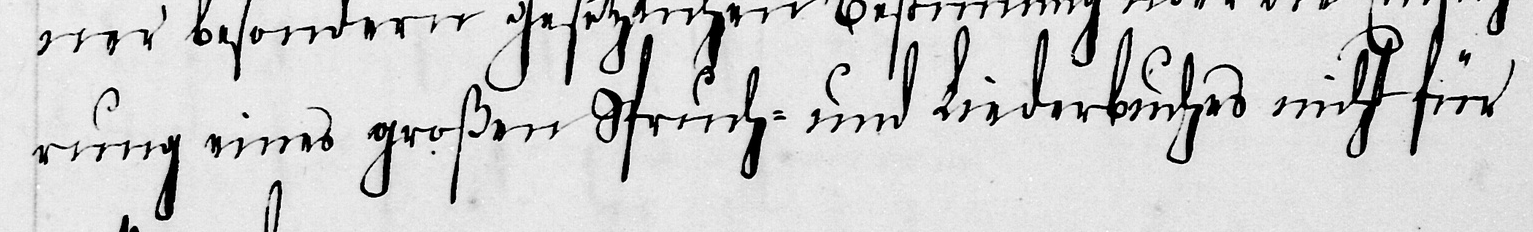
rung eines großen Spruch- und Liederbuches nicht für
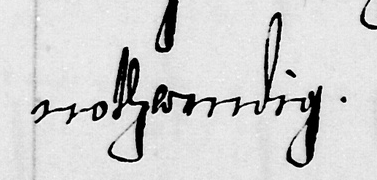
nothwendig.
